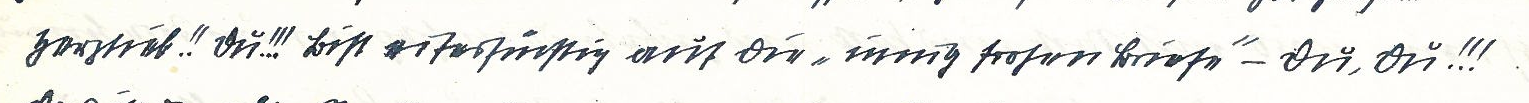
Herzlieb!! Du!!! Bist eifersüchtig auf die „innig frohen Briefe“ – Du, Du!!!
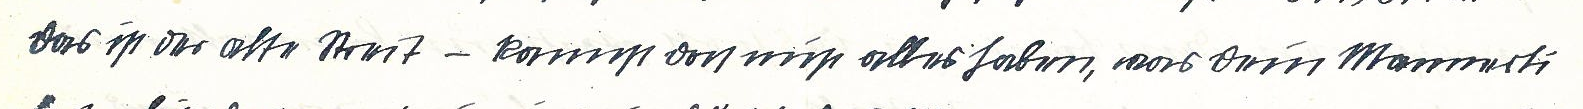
Das ist der alte Streit – kannst doch nicht alles haben, was Dein Mannerli
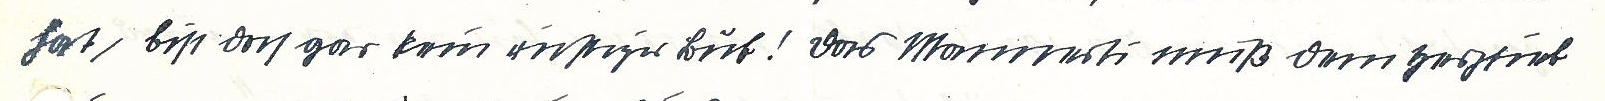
hat, bist doch gar kein richtiger Bub! Das Mannerli muß dem Herzlieb
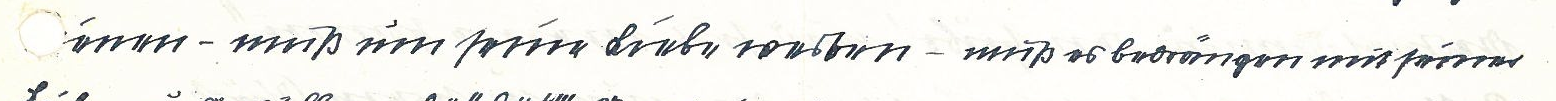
dienen – muß um seine Liebe werben – muß es bedrängen mit seiner
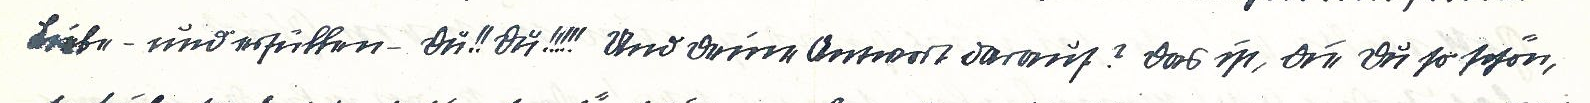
Liebe – und erfüllen – Du!! Du!!!!! Und Deine Antwort darauf? Das ist, die Du so schön,
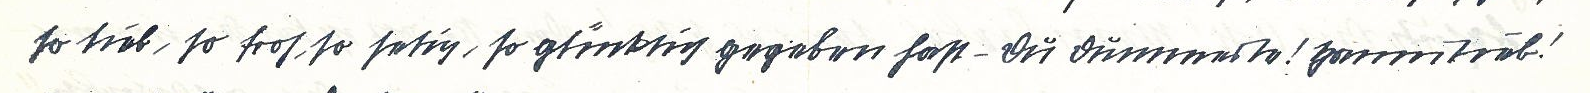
so lieb, so froh, so selig, so glücklich gegeben hast – Du Dummerle! lieb!
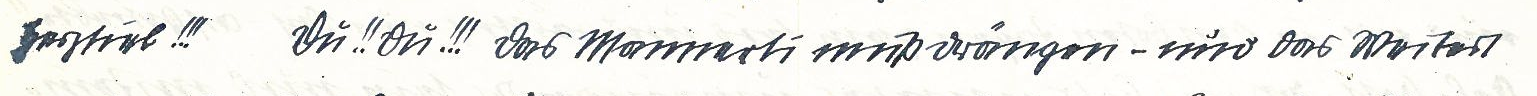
Herzlieb!!! Du!! Du!!! Das Mannerli muß drängen – und das Weiberl
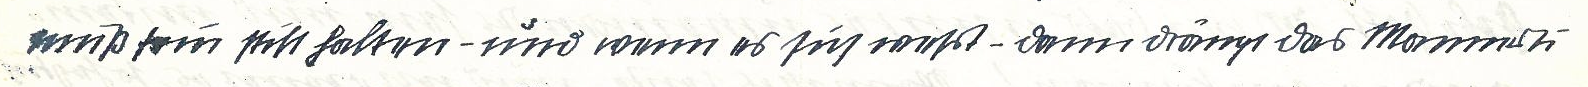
muß fein still halten – und wenn es sich wehrt – dann drängt das Mannerli
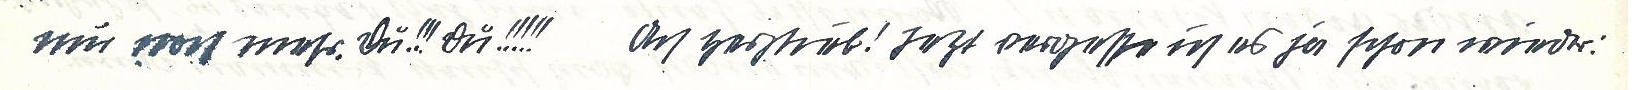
nur noch mehr. Du!!! Du!!!!! Ach Herzlieb! Jetzt vergesse ich es ja schon wieder:
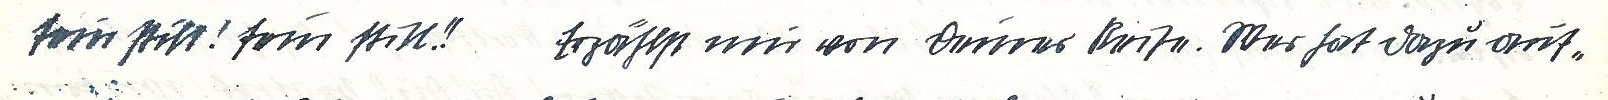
fein still! fein still! Erzählst mir von Deiner Reise. Wer hat dazu auf¬
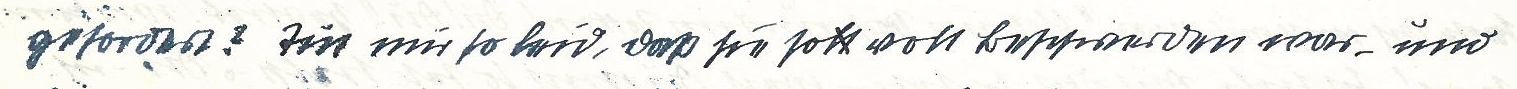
gefordert? Tut mir so leid, daß sie soll voll Beschwerden war, und
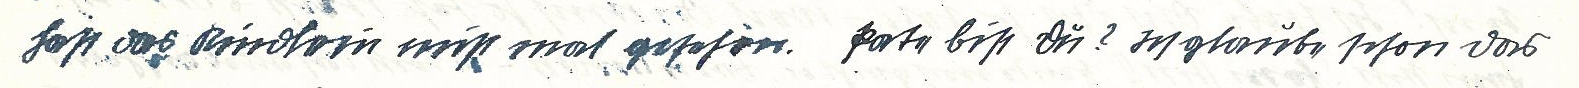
hast das Kindlein nicht mal gesehen. Pate bist Du? Ich glaube schon das
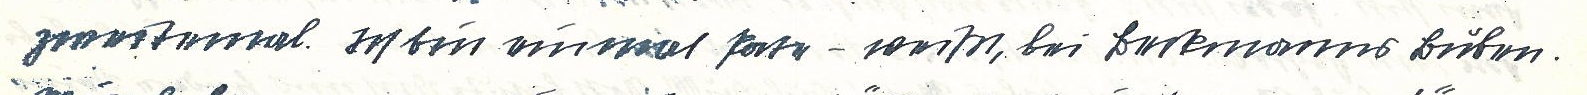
zweitemal. Ich bin einmal Pate – weißt, bei B.s Buben.
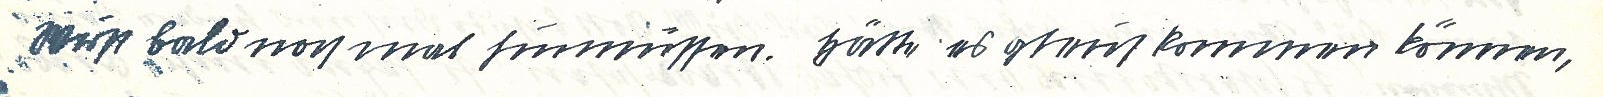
Wirst bald noch mal hinmüssen. Hätte es gleich kommen können,
